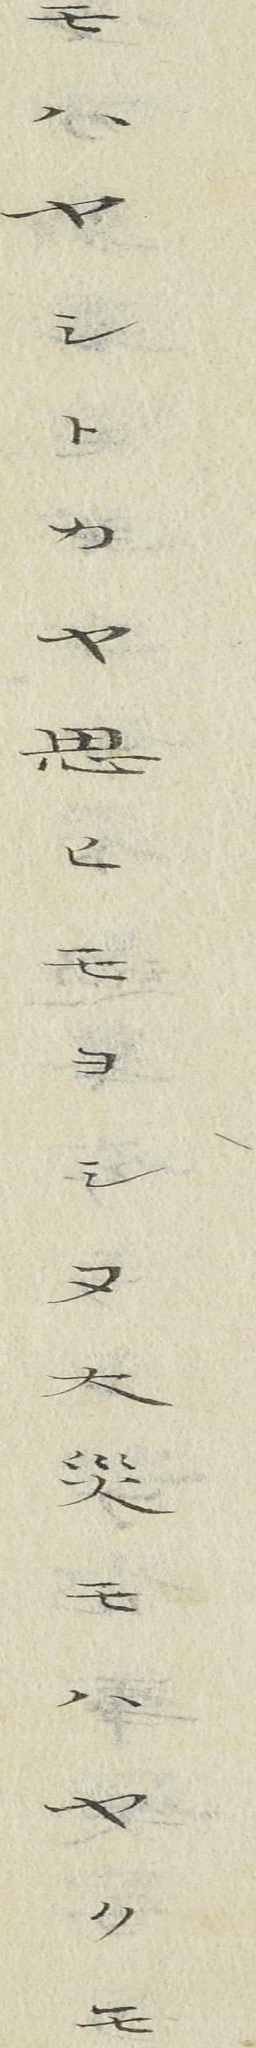モハヤシトカヤ思ヒモヨシヌ大災モハヤクモ
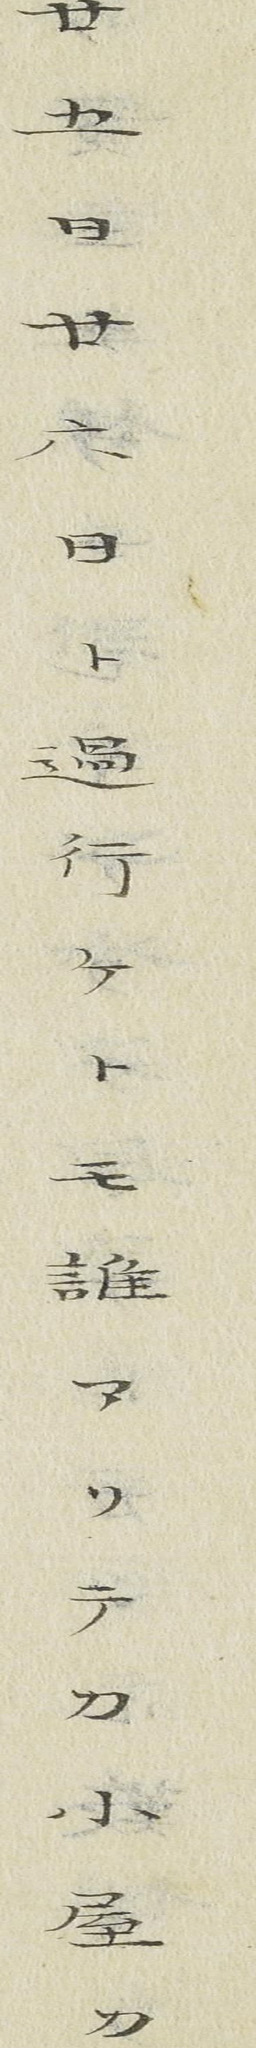廿五日廿六日ト過行ケトモ誰アリテカ小屋カ
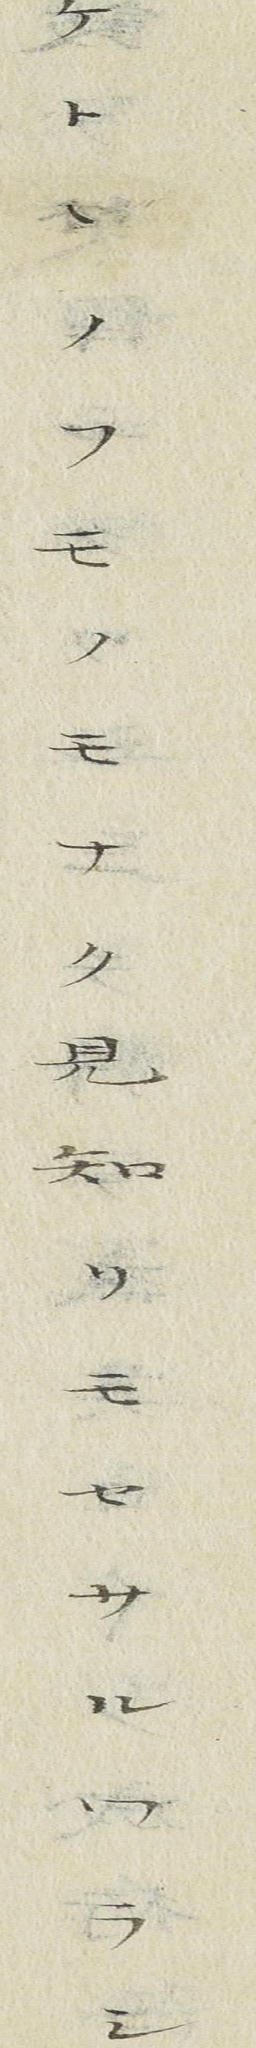ケトヽノフモノモナク見知リモセサルワラシ
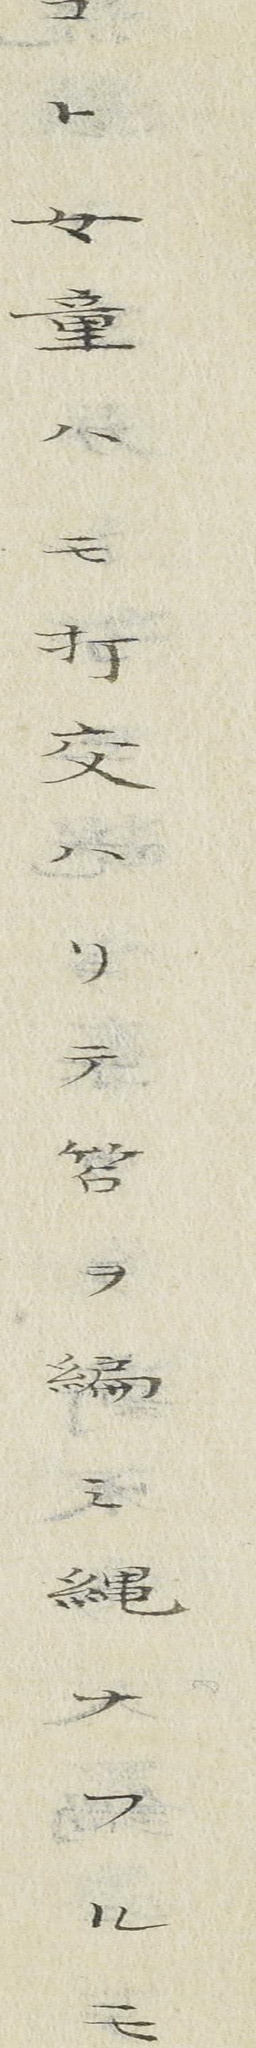コト女童ハモ打交ハリテ苫？ヲ編ミ縄ナフルモ
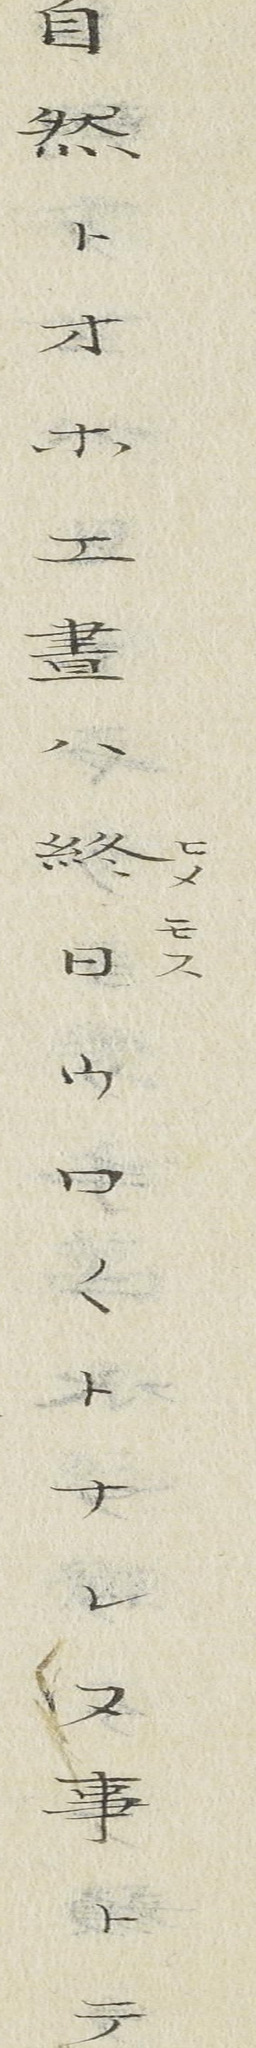自然トオホエ昼ハ終日ウロ〱トナレヌ事トテ
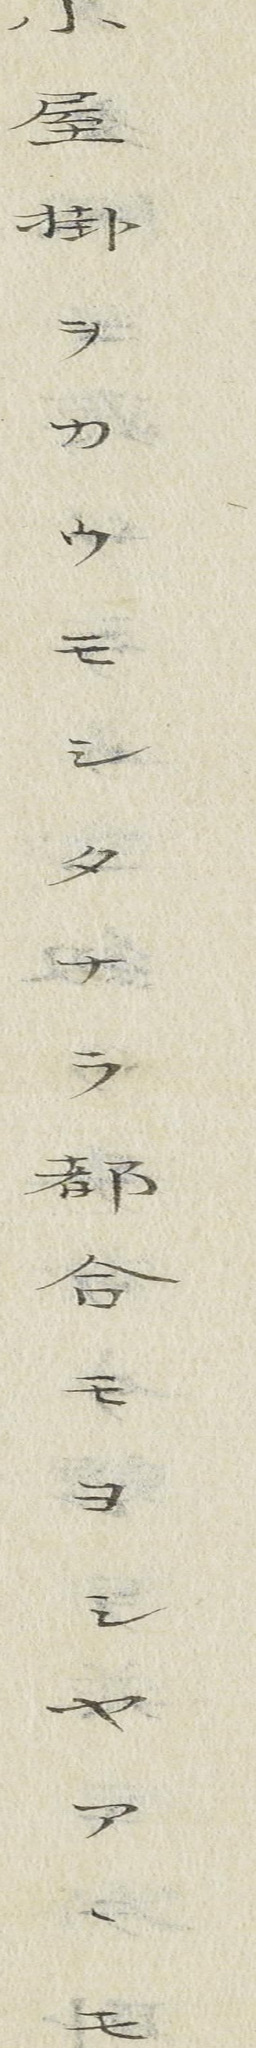小屋掛ヲカウモシタナラ都合モヨシヤアヽモ
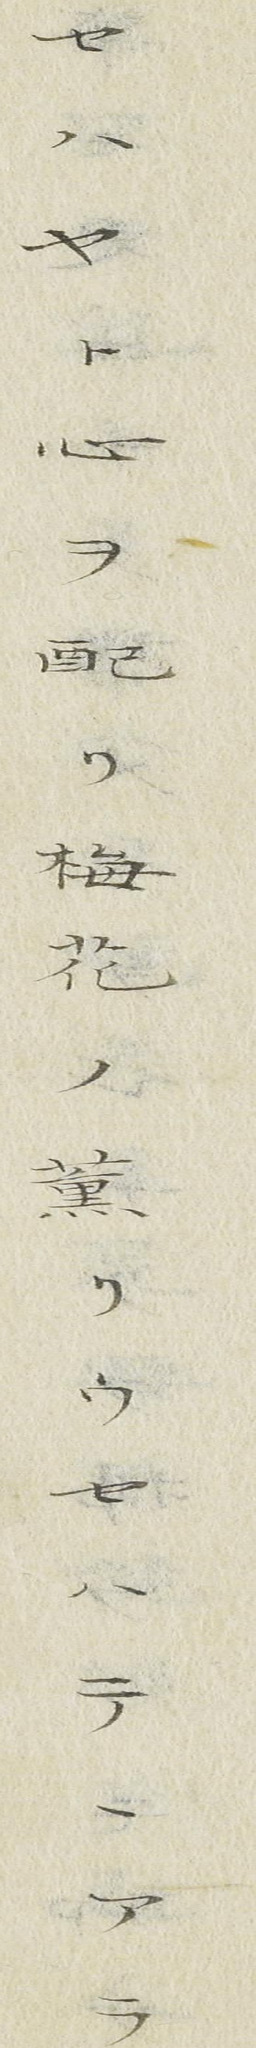セハヤト心ヲ配リ梅花ノ薫リウセハテヽアラ
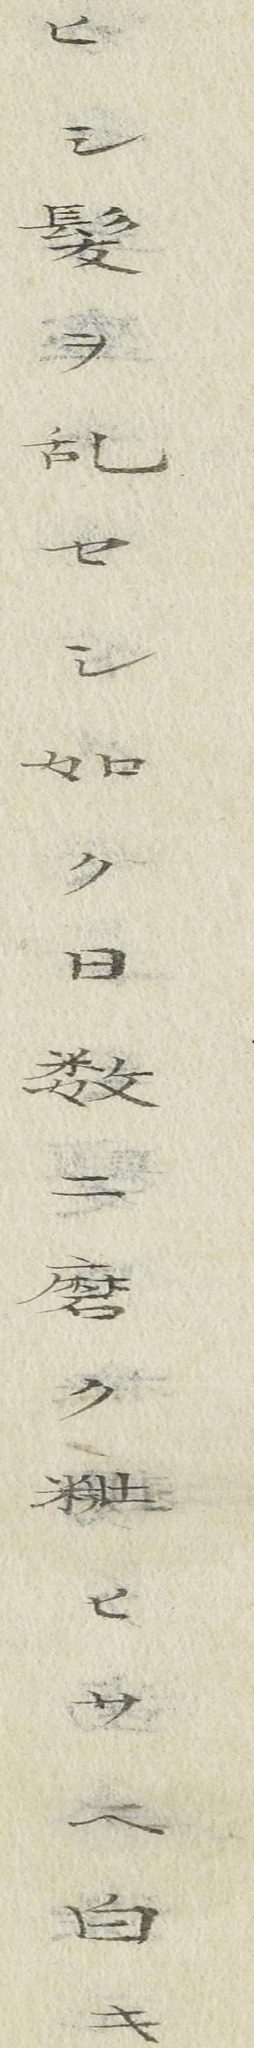ヒシ髪ヲ乱セシ如ク日数ニ磨ク粧ヒサヘ白キ
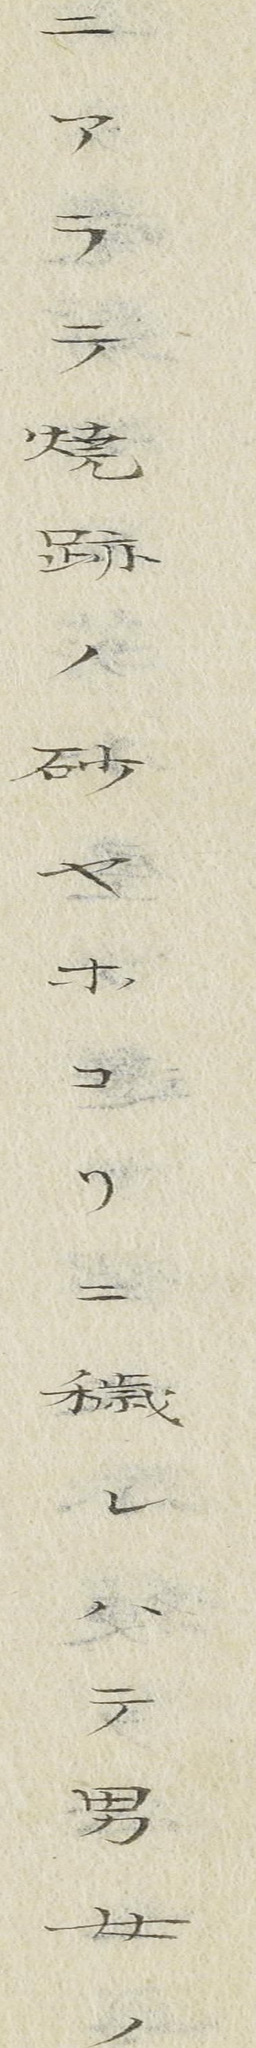ニアラテ焼跡ノ砂ヤホコリニ穢レハテ男女ノ
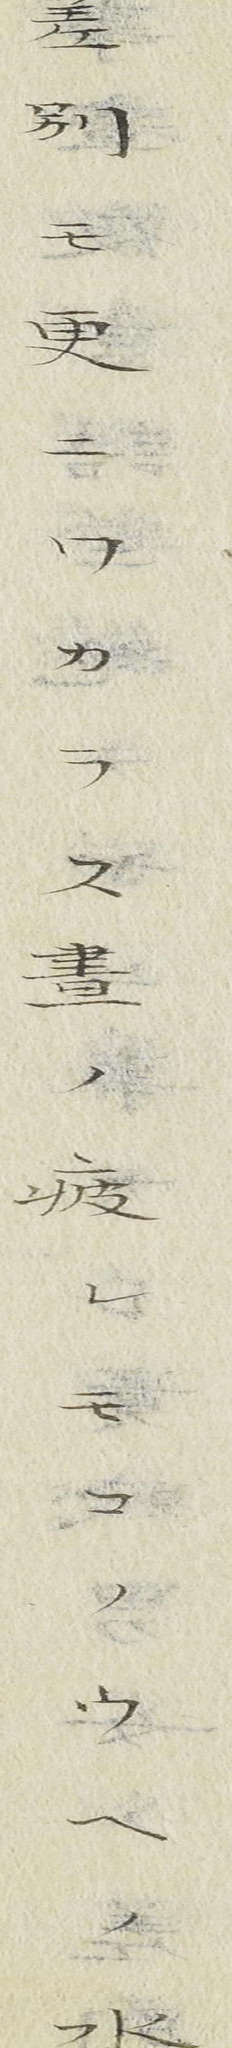差別モ更ニワカラス昼ノ疲レモコノウヘノ水
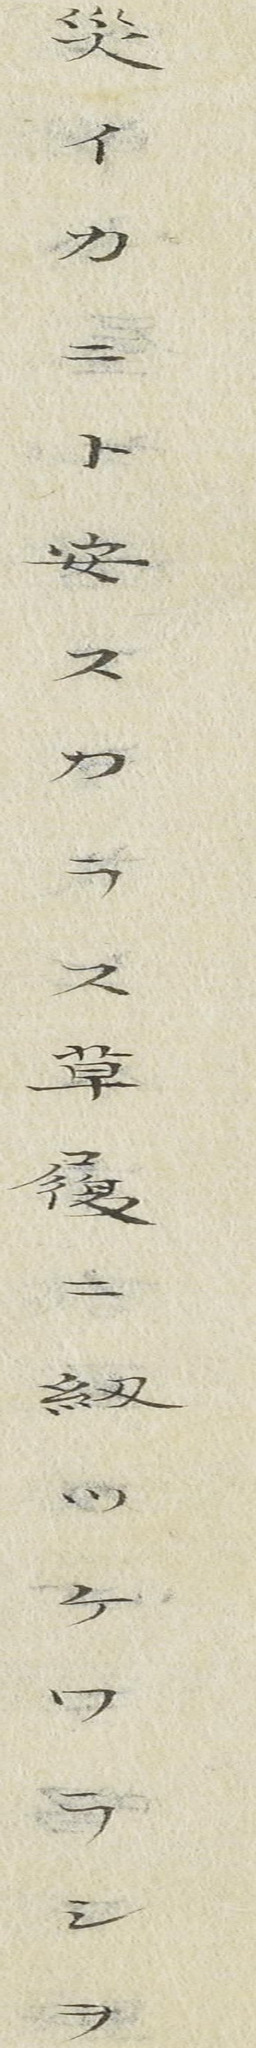災イカニト安スカラス草履ニ紐ツケワラシヲ
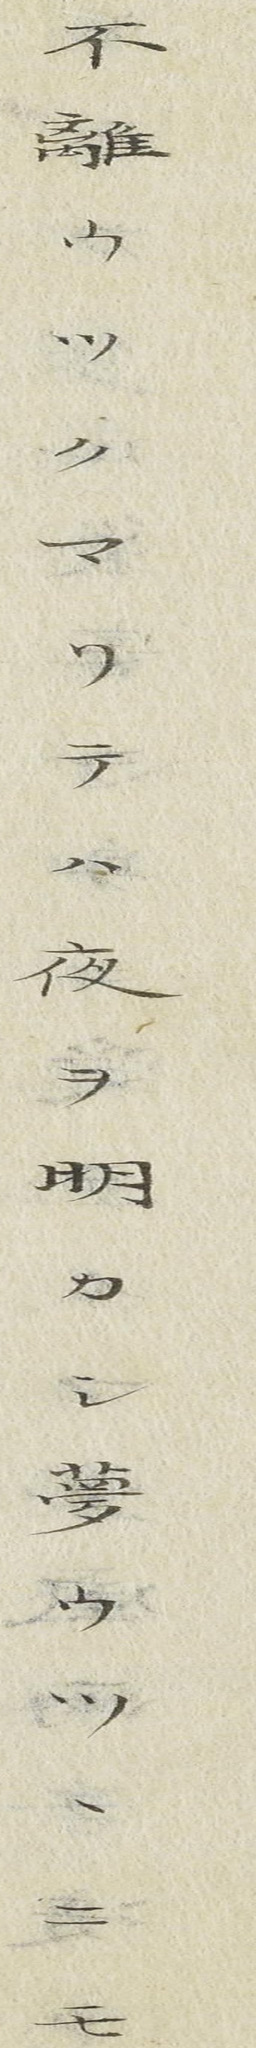不離ウツクマリテハ夜ヲ明カシ夢ウツヽニモ
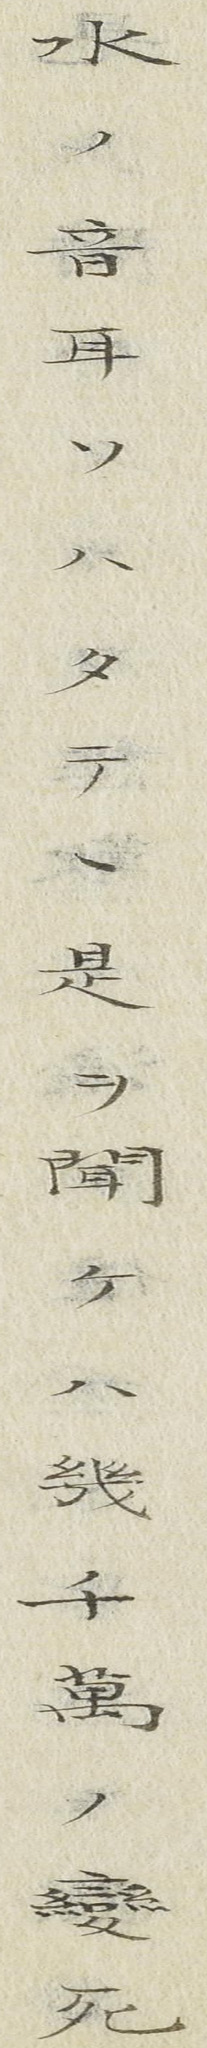水ノ音耳ソハタテヽ是ヲ聞ケハ幾千万ノ変死
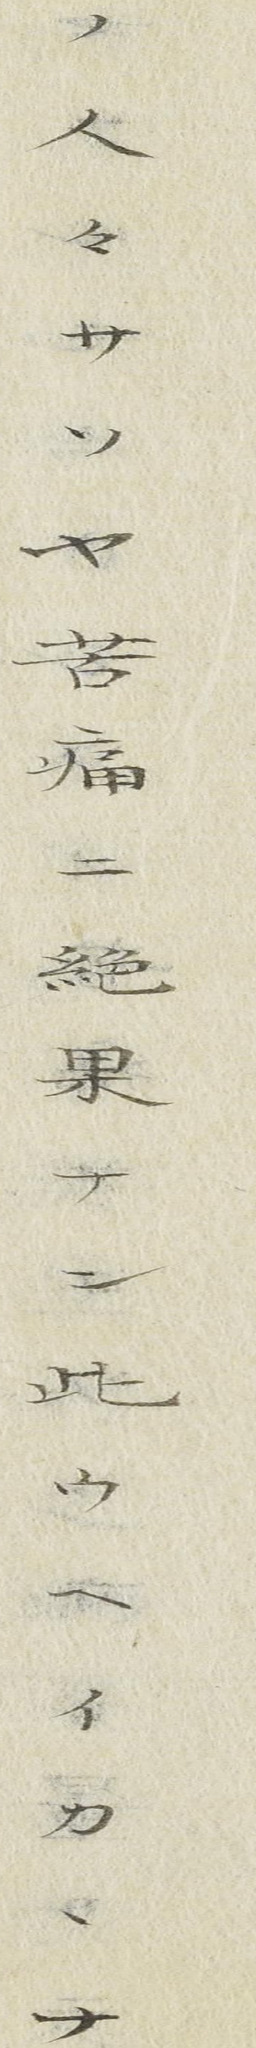ノ人々サソヤ苦痛ニ絶果ナン此ウヘイカヽナ
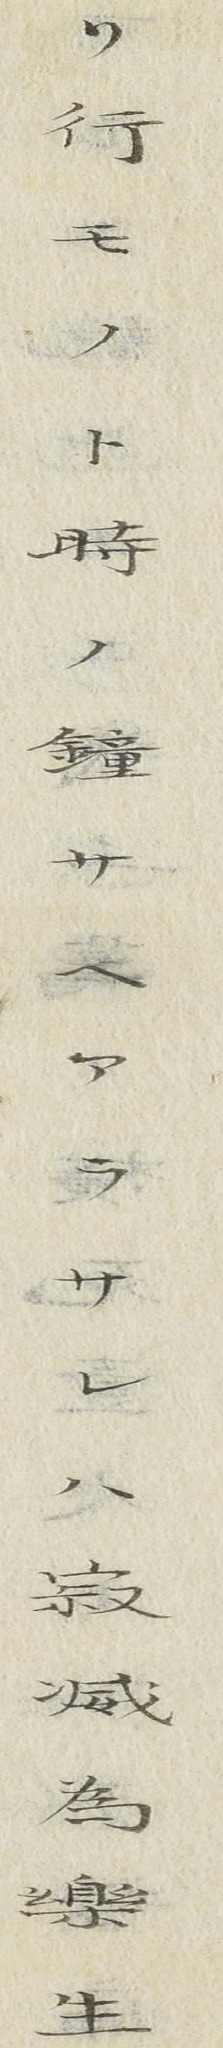リ行モノト時ノ鐘サヘアラサレハ寂滅為楽生
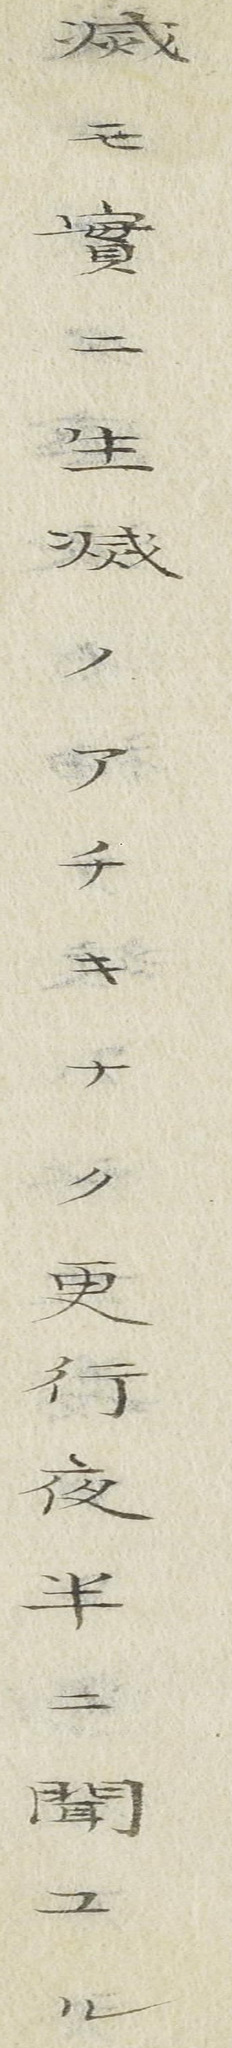滅モ実ニ生滅ノアチキナク更行夜半ニ聞ユル
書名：地災撮要　地震之部　巻ノ二
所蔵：東京大学地震研究所図書室 Earthquake Research Institute Library, The University of Tokyo, JAPAN
